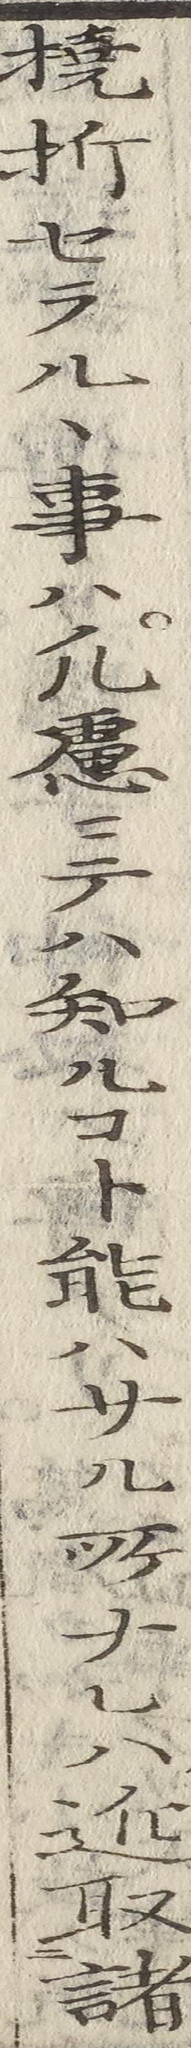橈折セラルヽ事ハ。凡慮ニテハ知ルコト能ハサル所ナレハ。近取諸
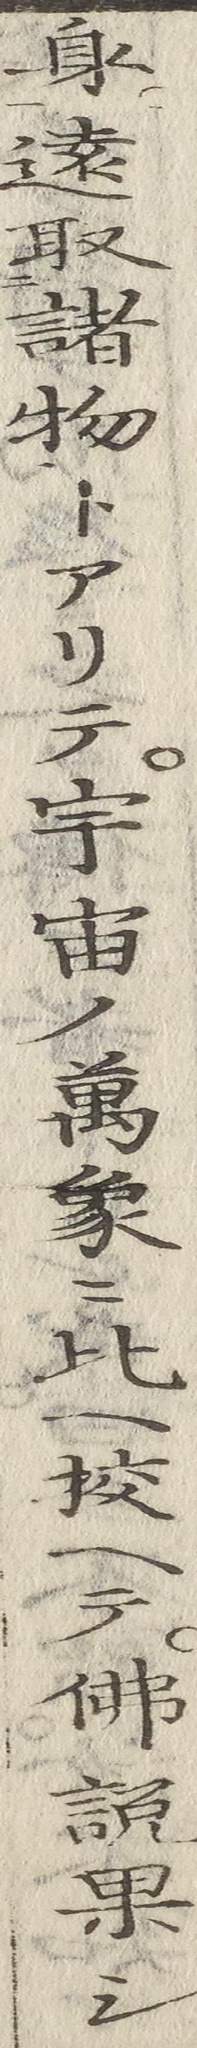身。遠取諸物トアリテ。宇宙ノ万象ニ比へ挍ヘテ。仏説果シ
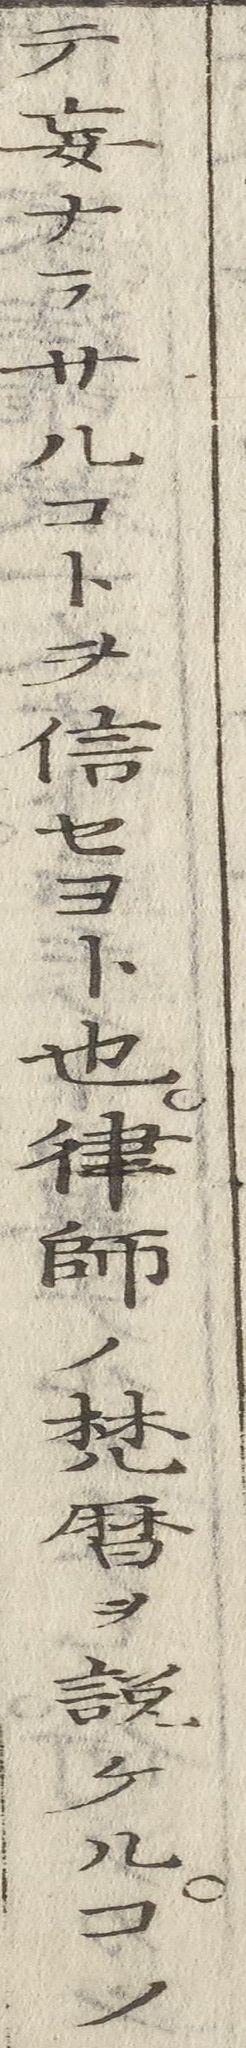テ妄ナラサルコトヲ信セヨト也。律師ノ梵暦ヲ説ケル。コノ
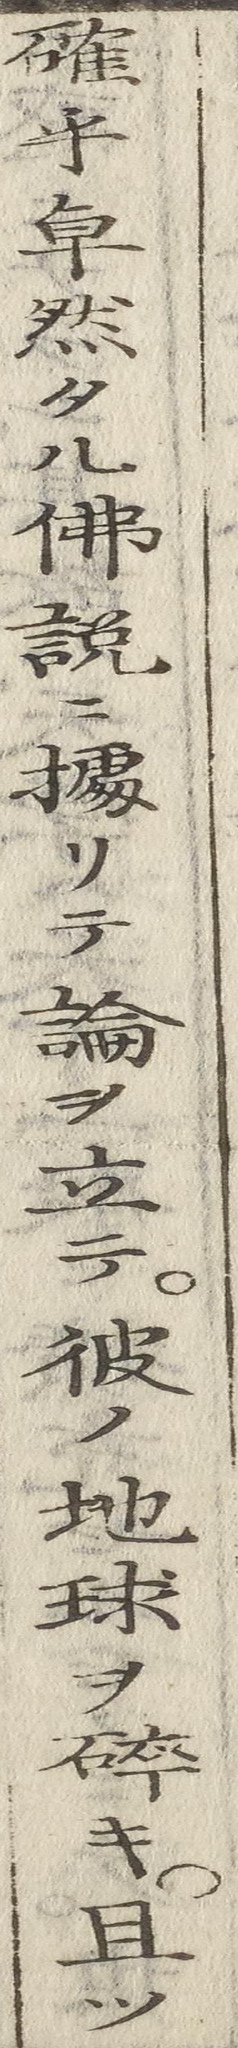確乎卓然タル仏説ニ拠リテ論ヲ立テ。彼ノ地球ヲ砕キ。且ツ
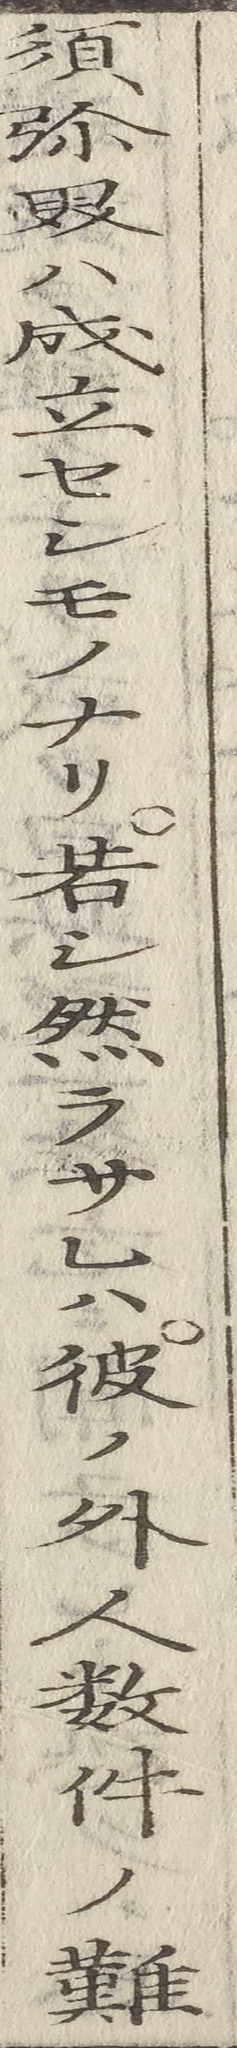須弥界ハ成立セシモノナリ。若シ然ラサレハ。彼ノ外人数件ノ難
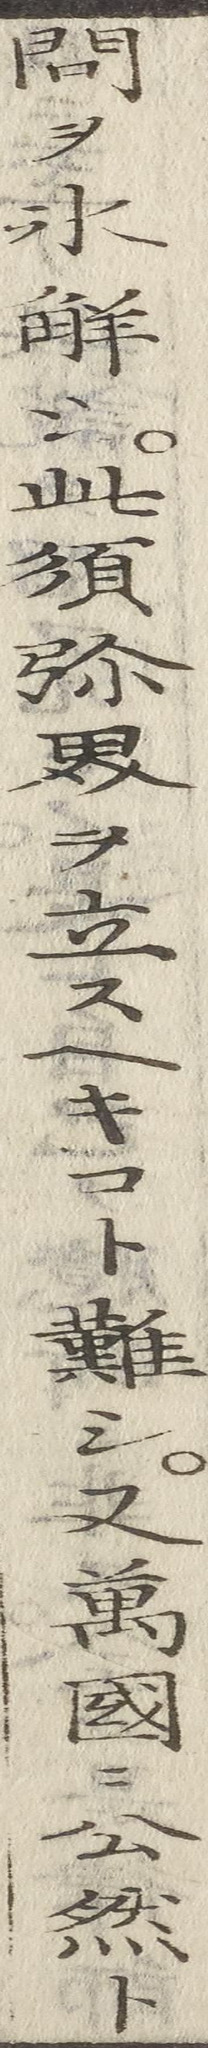問ヲ氷解シ。此須弥界ヲ立スヘキコト難シ。又万国ニ公然ト
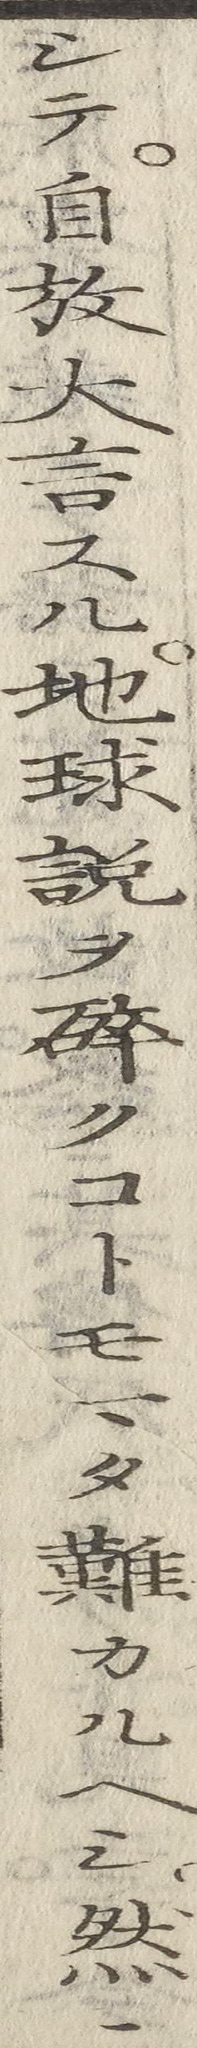シテ。自放大言スル。地球説ヲ砕クコトモマタ難カルヘシ。然ニ
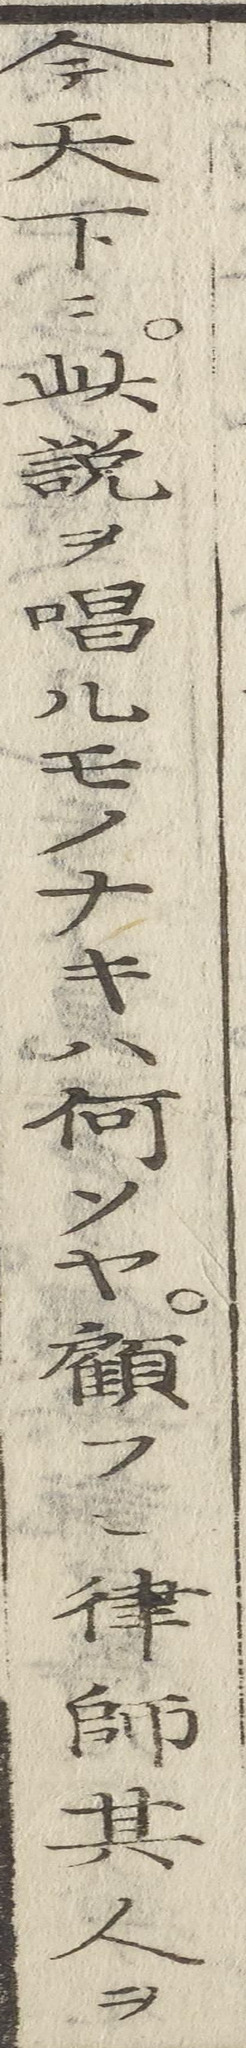今天下ニ。此説ヲ唱ルモノナキハ何ソヤ。顧フヽ律師其人ヲ

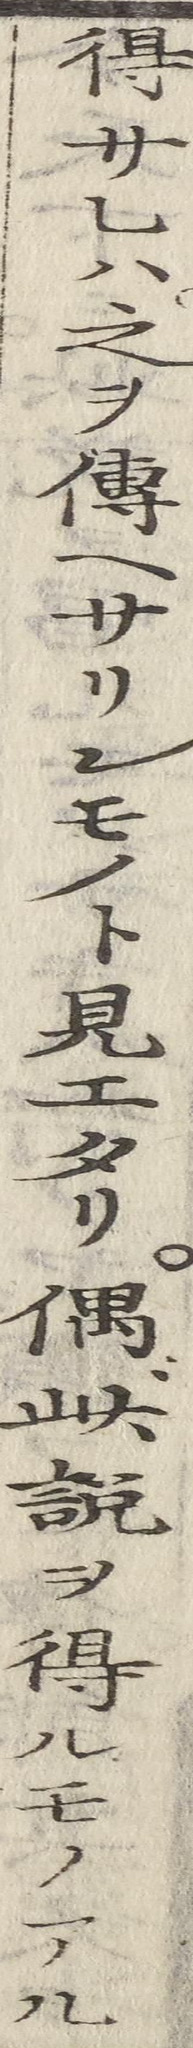得サレハ。之ヲ伝ヘサリシモノト見エタリ。偶、此説ヲ得ルモノアル
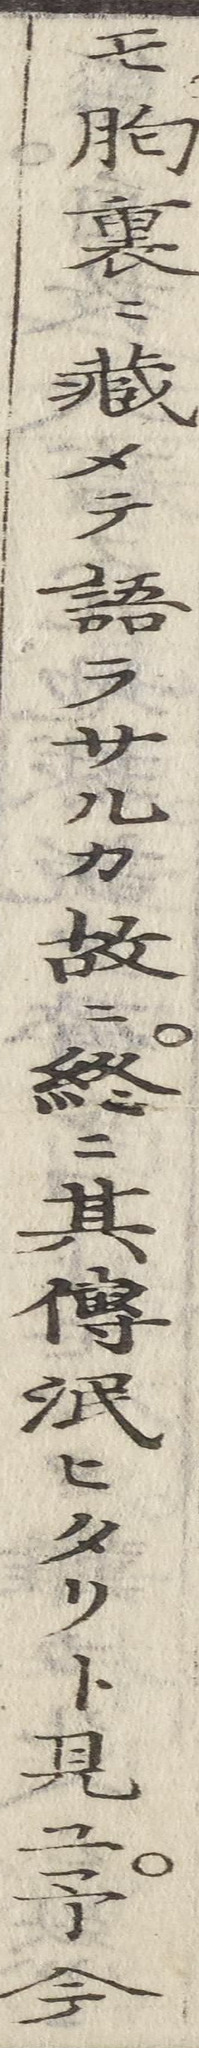モ。胸裏ニ蔵メテ語ラサルカ故ニ。終ニ其伝泯ヒタリト見ユ。予今
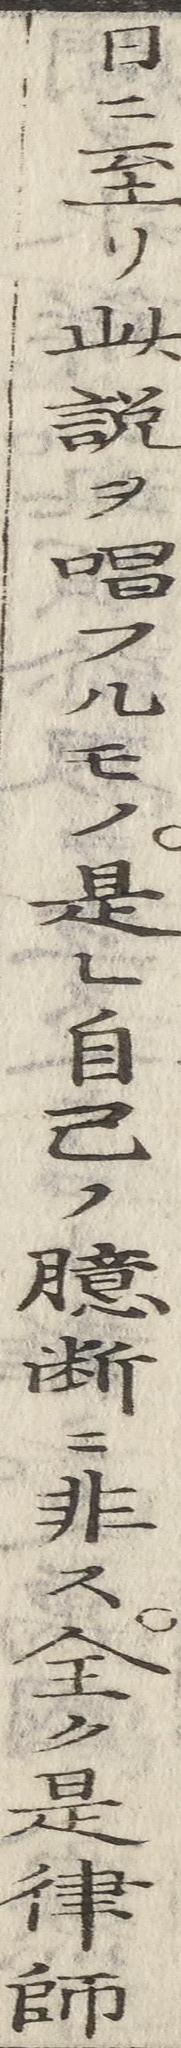日ニ至リ此説ヲ唱フルモノ。是レ自己ノ臆断ニ非ス。全ク是律師
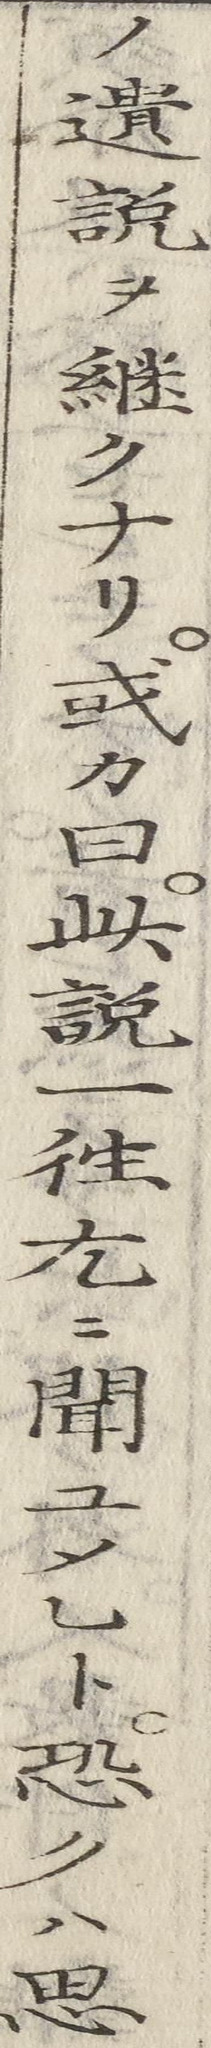ノ遺説ヲ継クナリ。或カ曰。此説一往左ニ聞ユメレト。恐クハ思
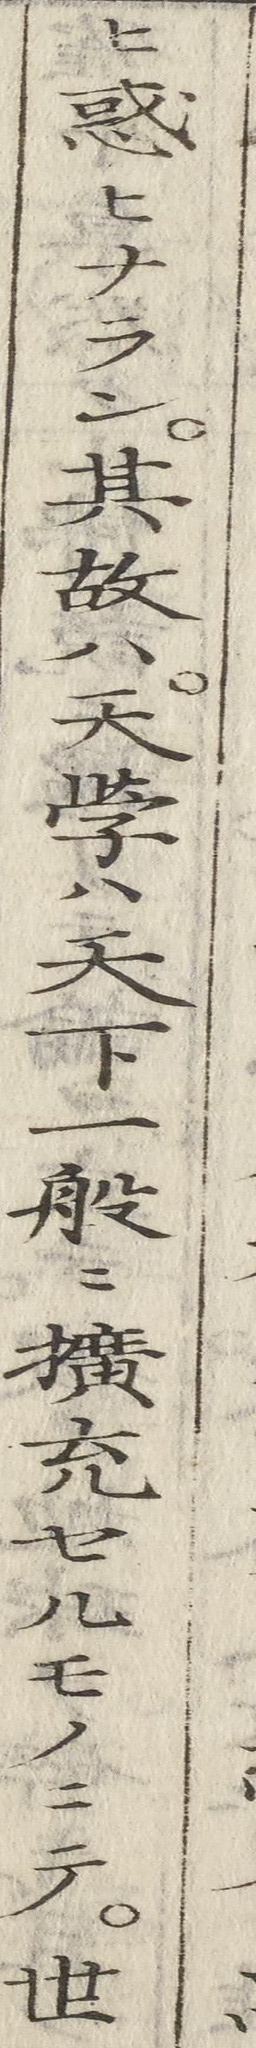ヒ惑ヒナラン。其故ハ。天学ハ天下一般ニ拡充セルモノニテ。世
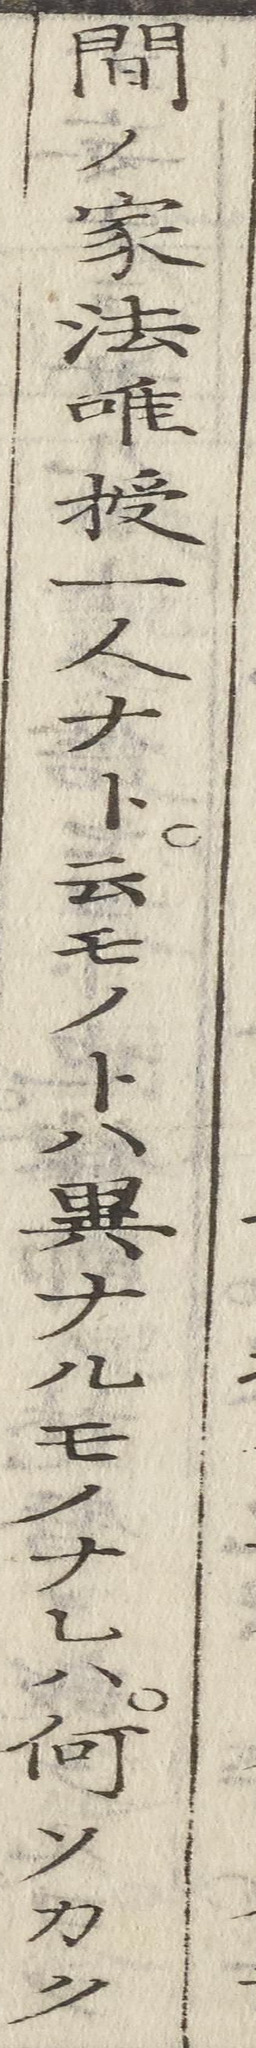間ノ家法唯授一人ナト。云モノトハ異ナルモノナレハ。何ソカク
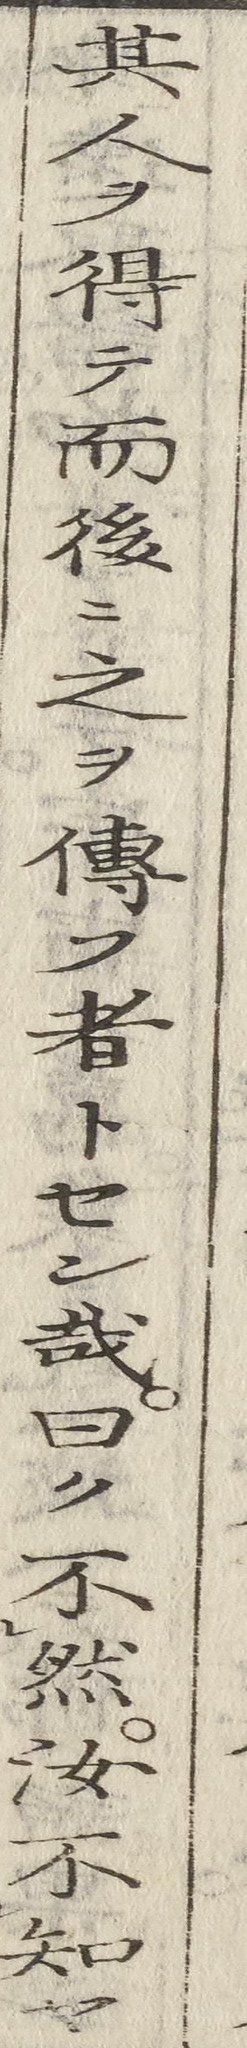其人ヲ得テ而後ニ之ヲ伝フ者トセン哉。曰ク不然。汝不知ヤ
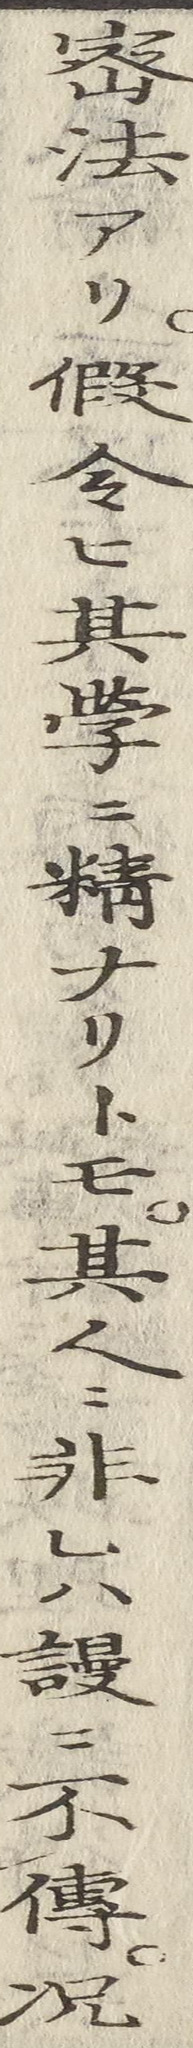密法アリ。仮令ヒ其学ニ精ナリトモ。其人ニ非レハ謾ニ不伝。況
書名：護法新論　上
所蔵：東京大学地震研究所図書室 Earthquake Research Institute Library, The University of Tokyo, JAPAN
